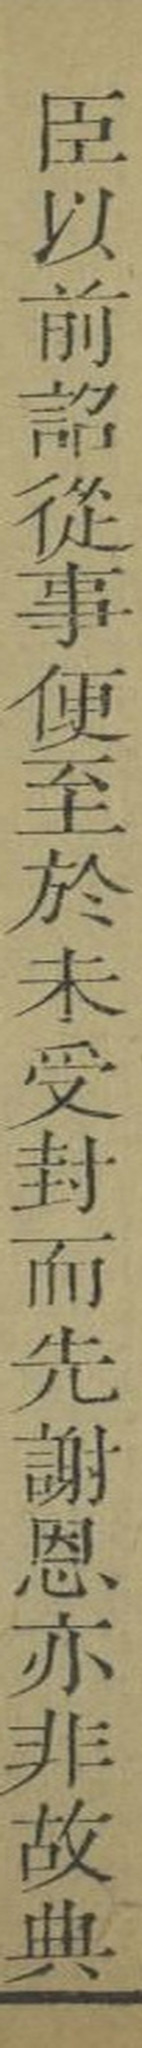臣以前詔従事便至於未受封而先謝恩亦非故典
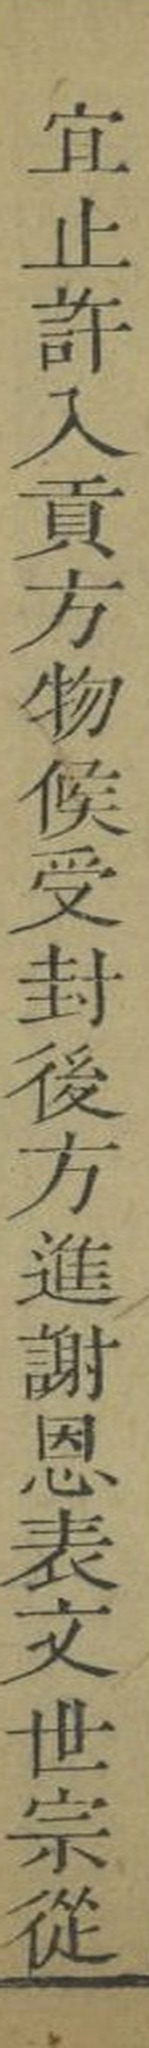宜止許入貢方物候受封後方進謝恩表文世宗従
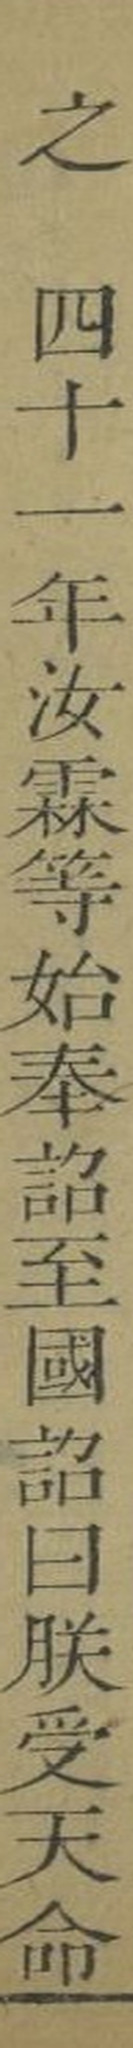之四十一年汝霖等始奉詔至国詔曰朕受天命
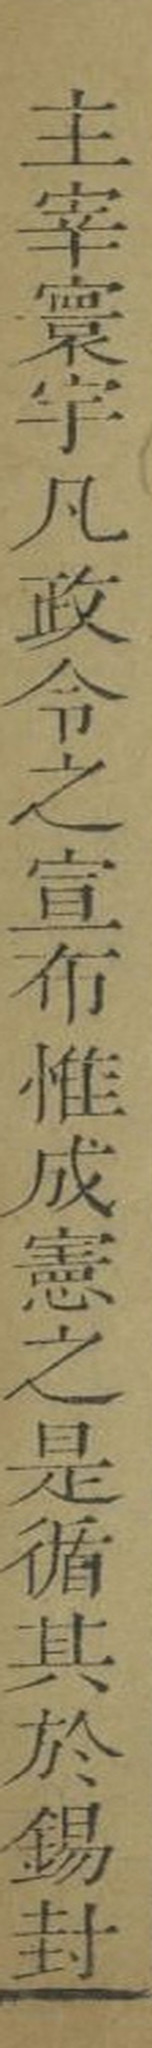主宰寰宇凡政令之宣布惟成憲之是循其於錫封

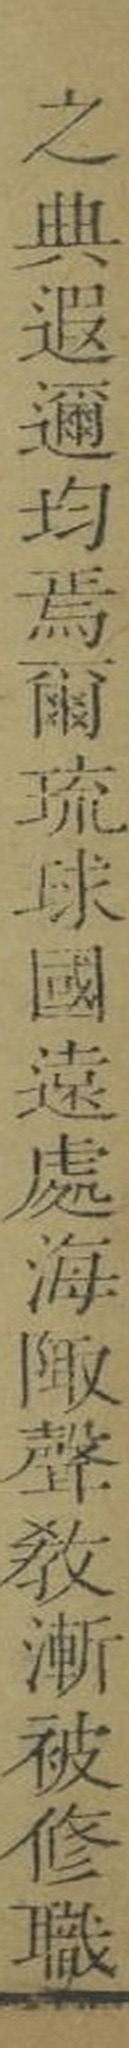之典遐邇均焉爾琉球国遠処海陬声教漸被修職
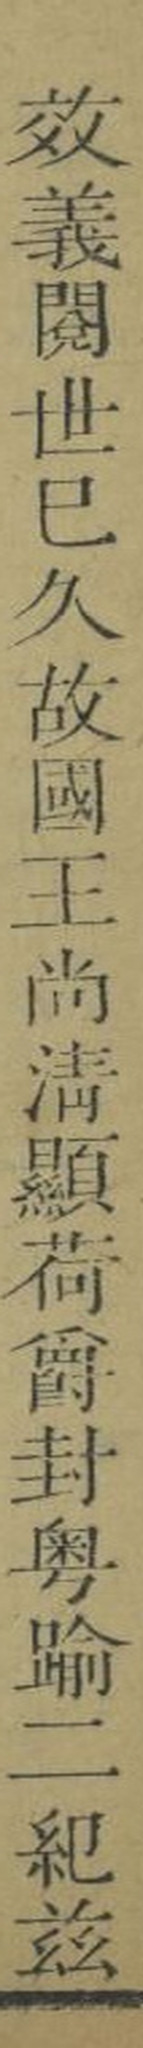效義閲世巳久故国王尚清顕荷爵封粤踰二紀茲
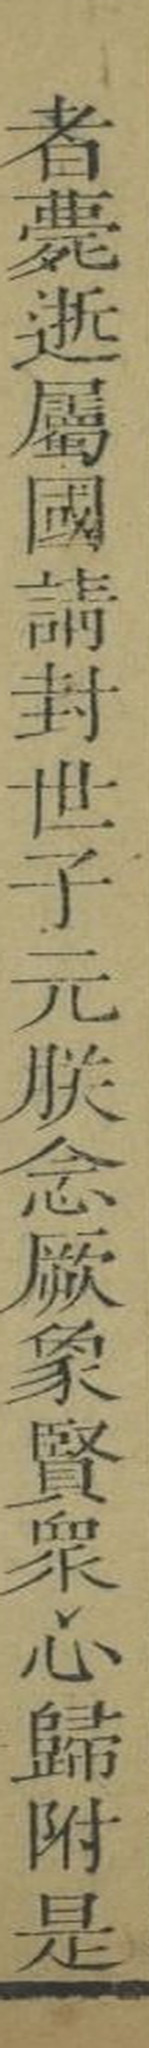者薨逝属国請封世子元朕念厥象賢衆心帰附是
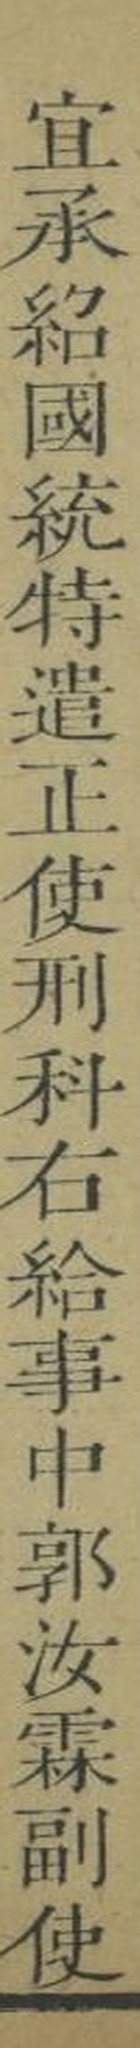宜承紹国統特遣正使刑科右給事中郭汝霖副使
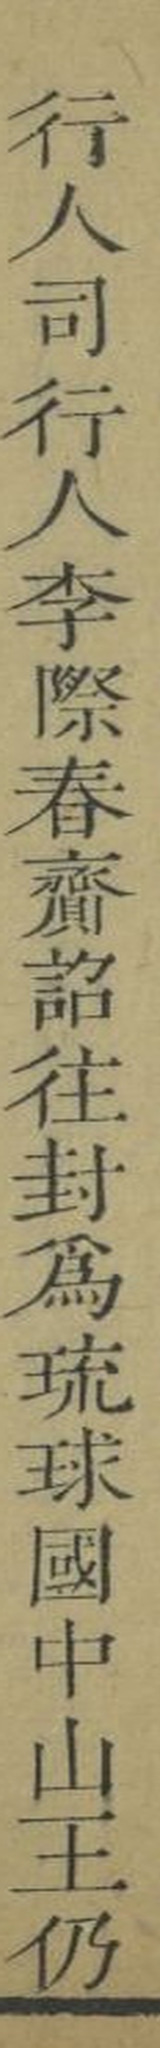行人司行人李際春齎詔往封為琉球国中山王仍
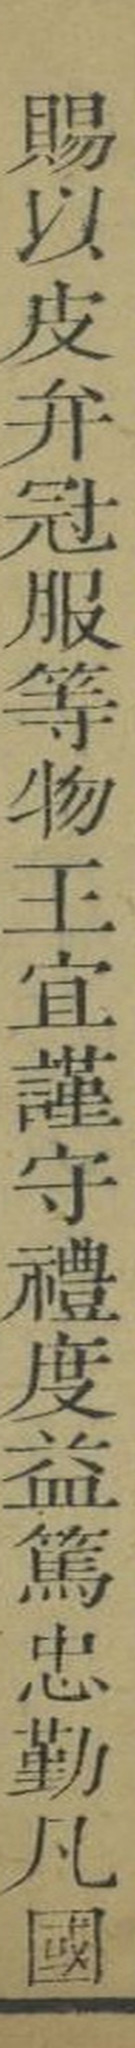賜以皮弁冠服等物王宜謹守礼度益篤忠勤凡国
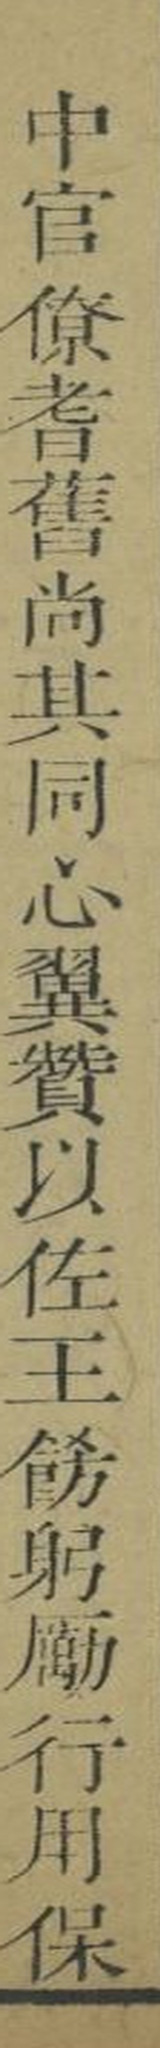中官僚耆旧尚其同心翼賛以佐王餝躬励行用保
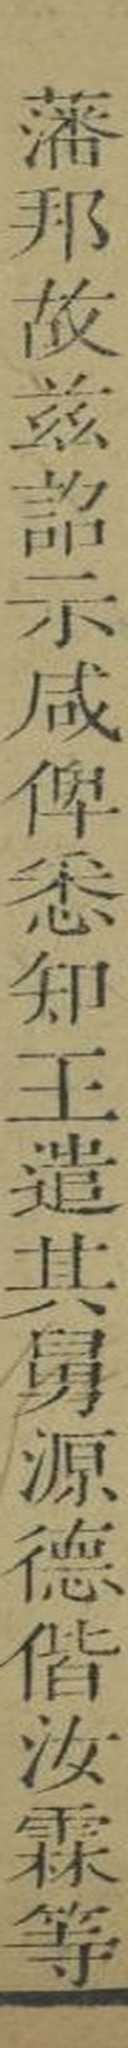藩邦故茲詔示咸俾悉知王遣其舅源徳偕汝霖等
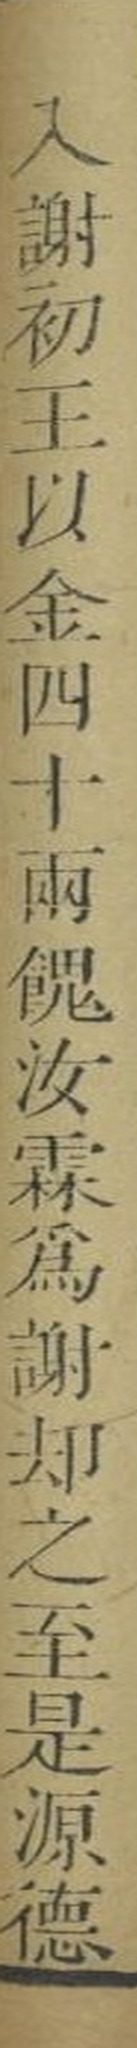入謝初王以金四十両餽汝霖為謝却之至是源徳
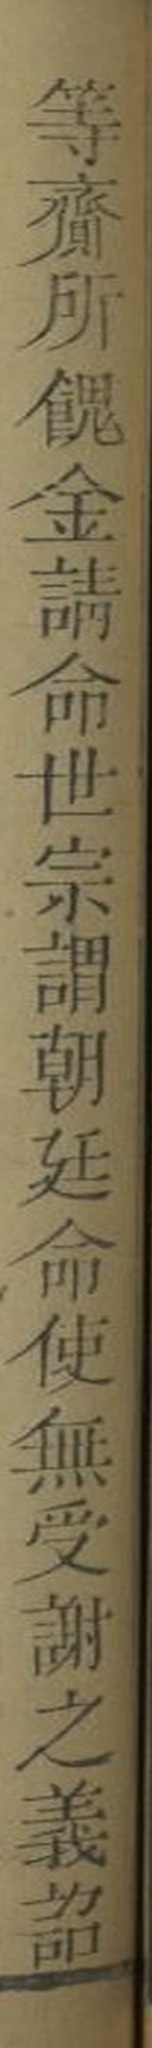等齎所餽金請命世宗謂朝廷命使無受謝之義詔
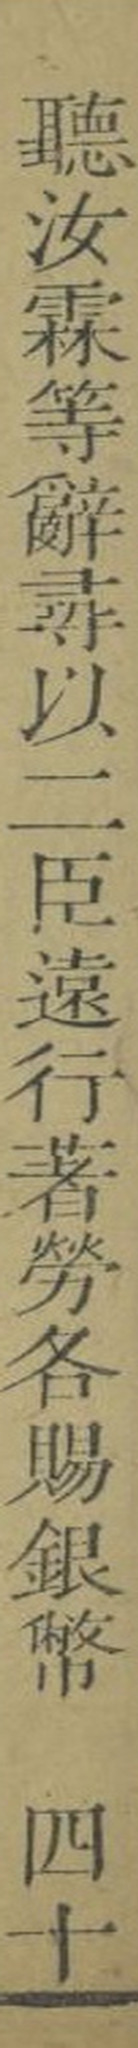聴汝霖等辞尋以二臣遠行著労各賜銀幣四十
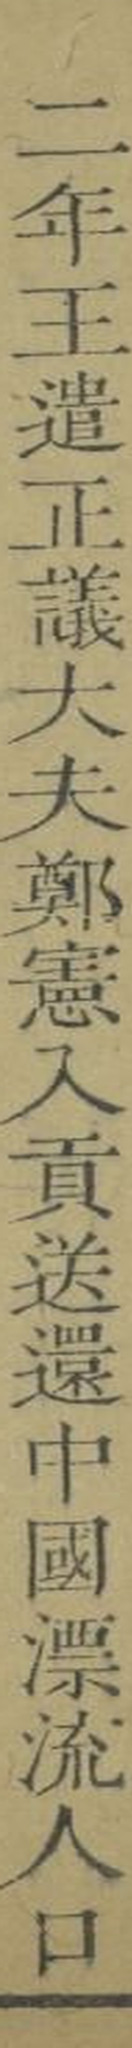二年王遣正議大夫鄭憲入貢送還中国漂流人口
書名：中山伝信録 巻三
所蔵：University of the Ryukyus Library
